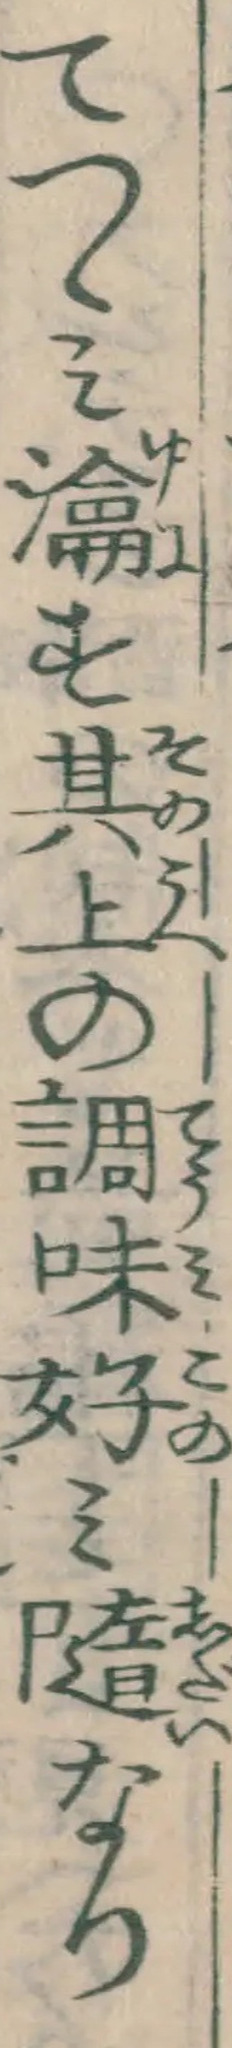てつゝみ瀹す其上の調味好み随なり
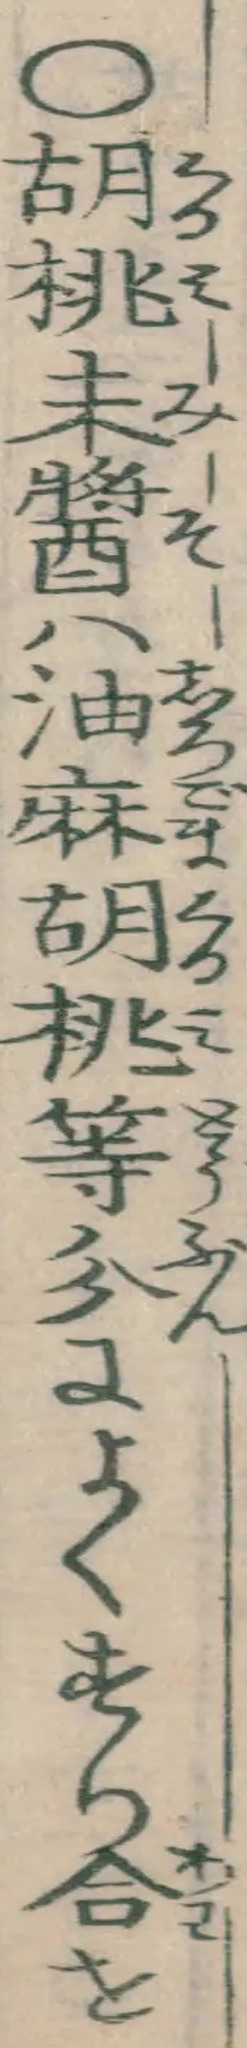○胡桃味醤は油麻胡桃等分によくすり合せ
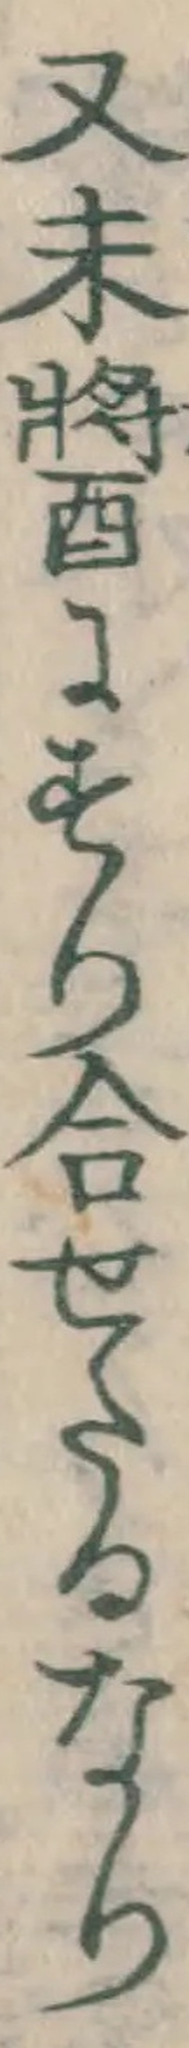又未醤にすり合せたるなり
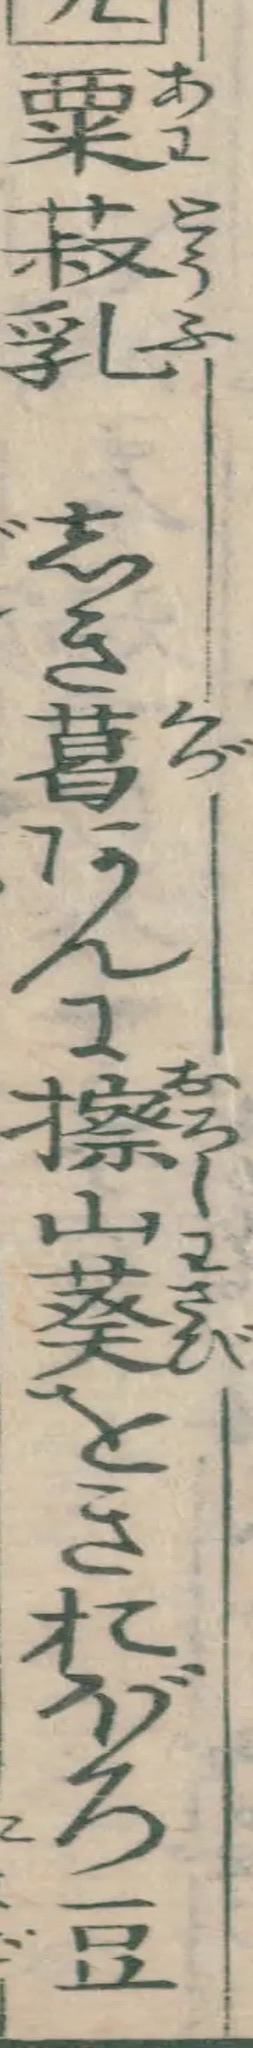卅九粟菽乳しき葛あんに擦山葵をきおぼろ豆
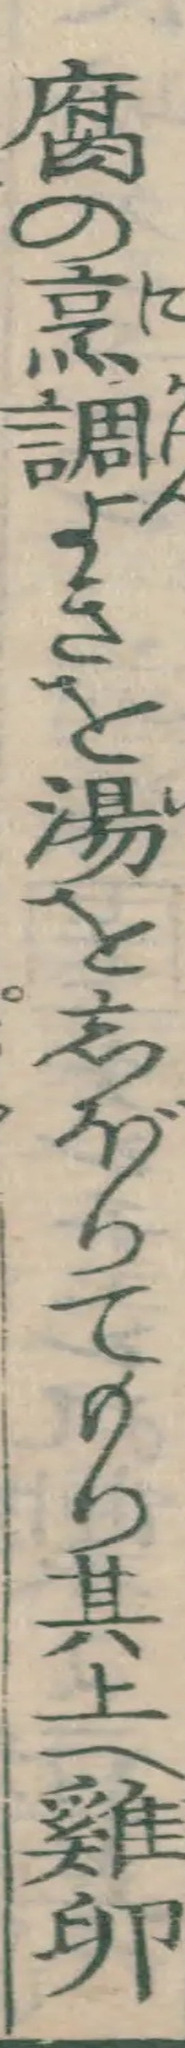腐の烹調よきを湯をしぼりてもり其上へ鶏卵
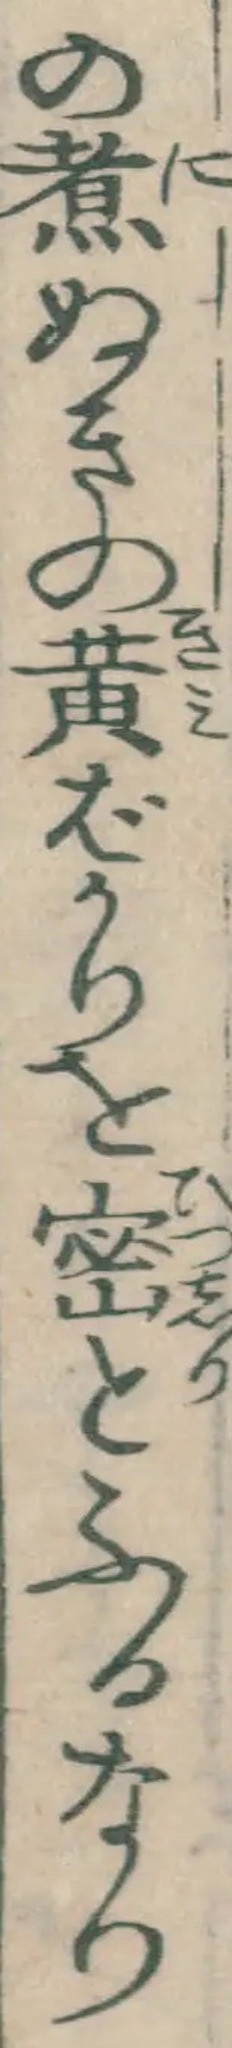の煮ぬきの黄ばかりを密とふるなり

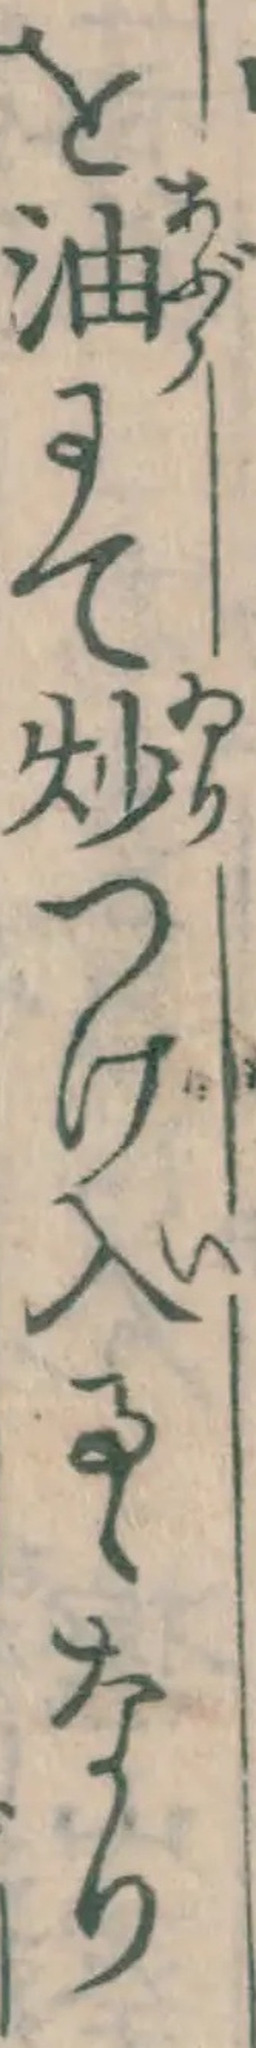を油にて炒つけ入るゝなり
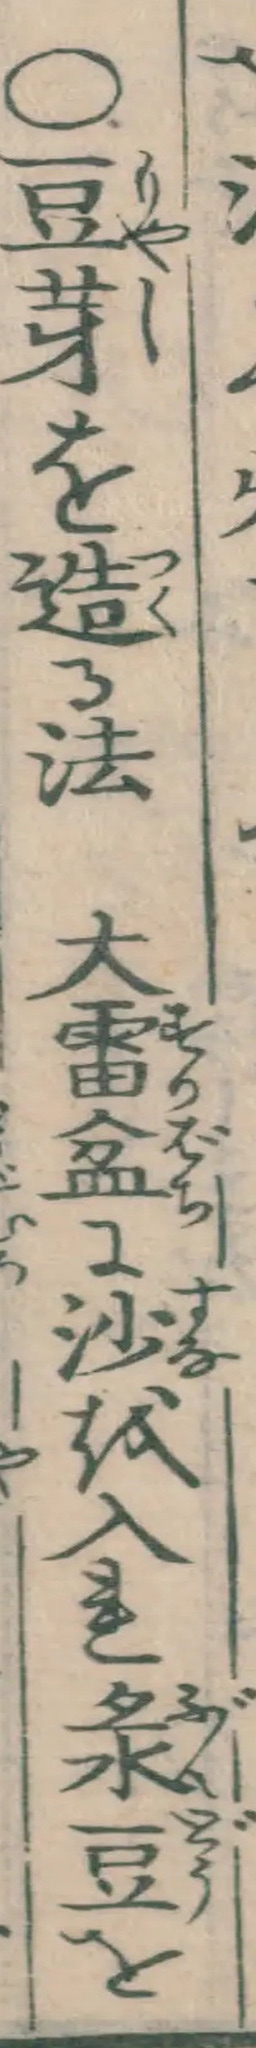○豆芽を造る法大雷盆に沙を入れ彔豆を
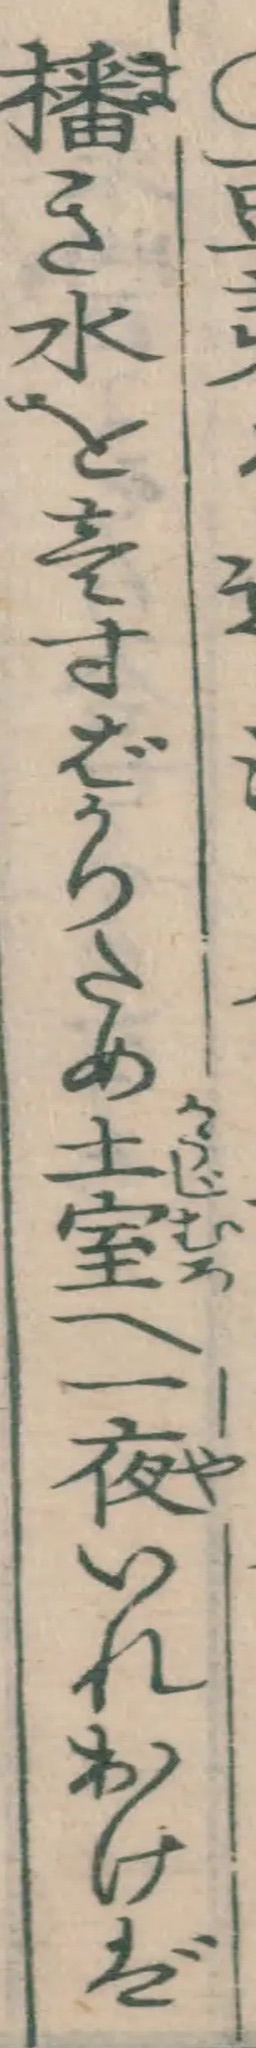播き水を壱寸ばかりため土室へ一夜いれおけば
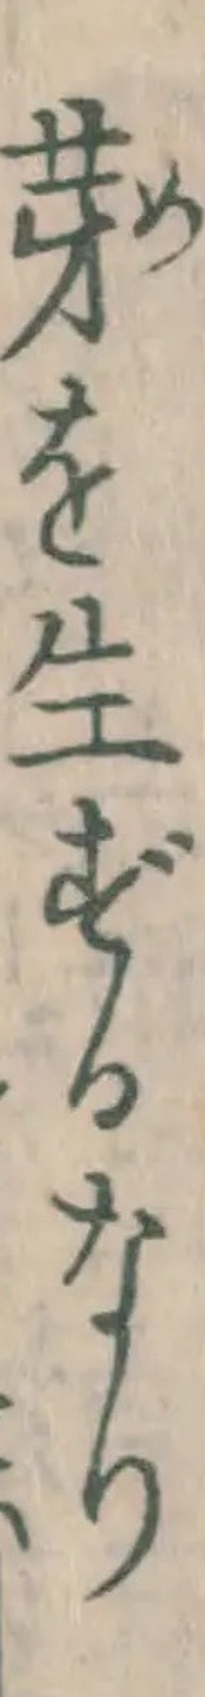芽を生ずるなり
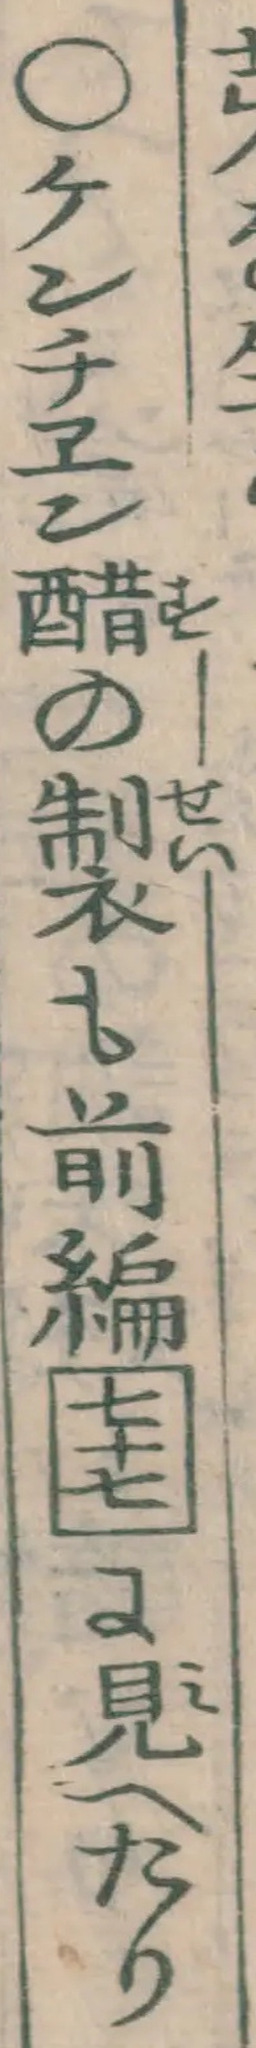○ケンチヱン醋の製も前編七十七に見へたり
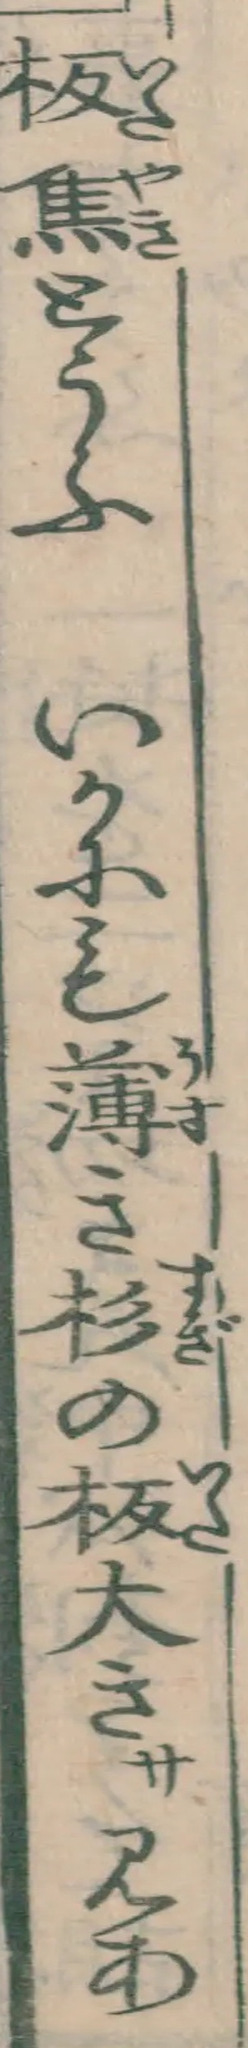四十二板焦とうふいかにも薄き杉の板大きさ見あ
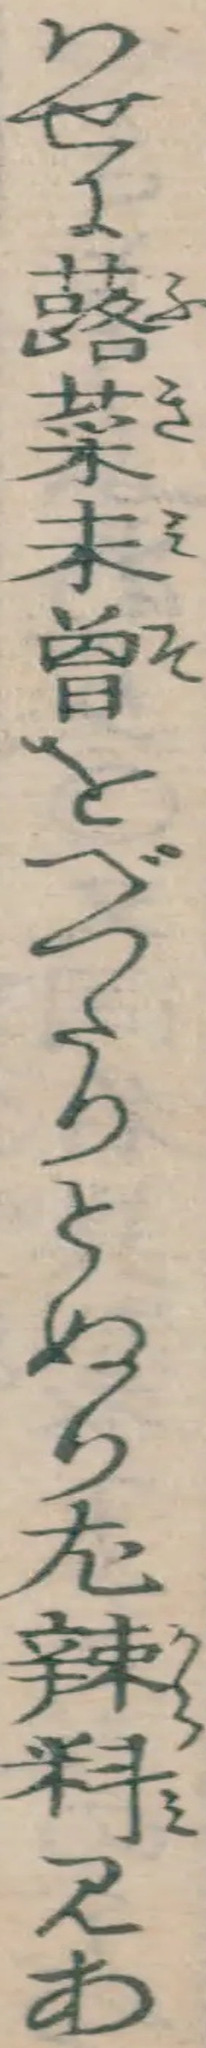はせに蕗菜未曽をべつたりとぬり尤辣料見あ
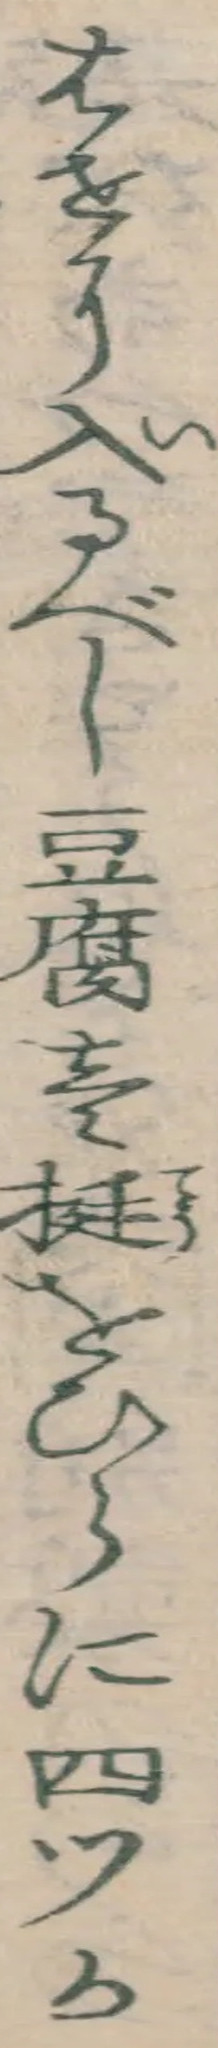はせに入るべし豆腐壱挺をひらに四つか
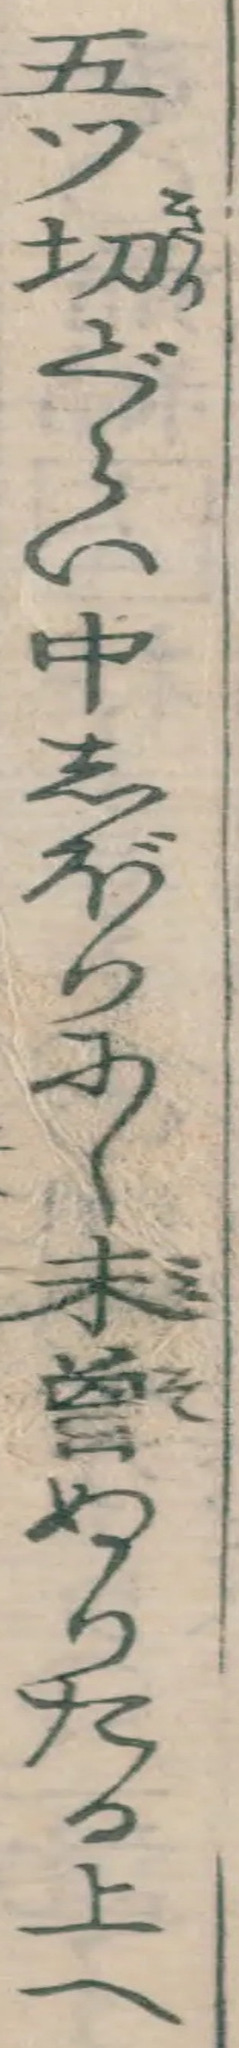五つ切ぐらい中しぼりにし未曽ぬりたる上へ
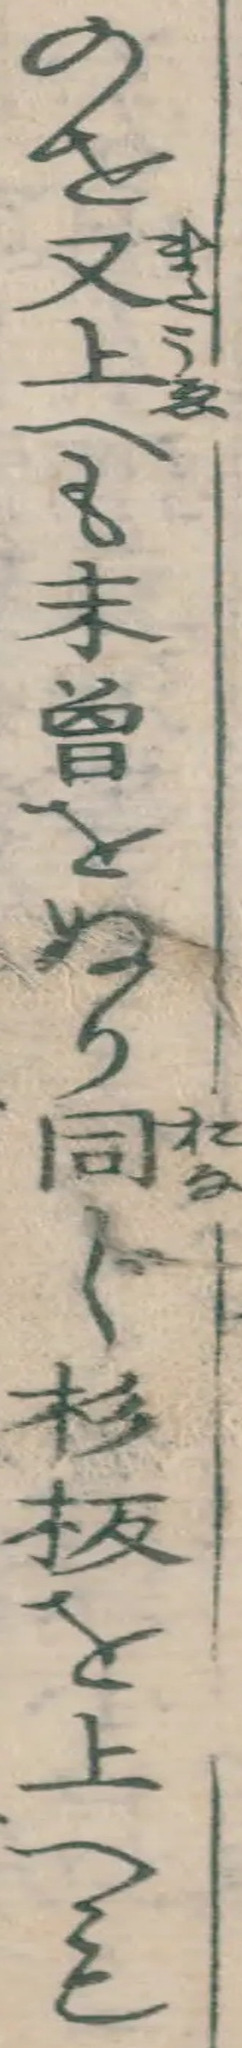のせ又上へも未曽をぬり同じ杉板を上へも
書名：豆腐百珍. 続編
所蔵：国立国会図書館 National Diet Library, JAPAN
